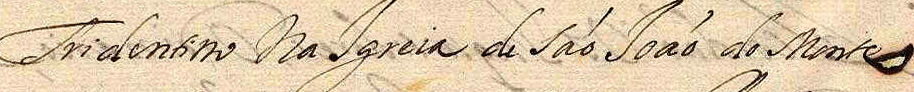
Tridentino na Igreia de Saõ Joaõ do Monte
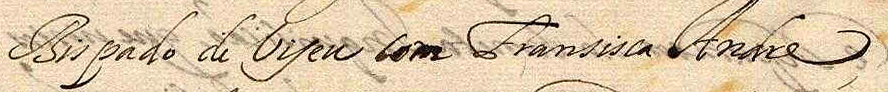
Bispado de Viseu com Fransisca Andre,
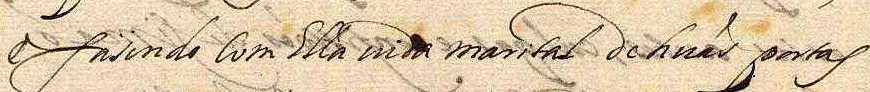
e fasendo com Ella uida marital de huās portas
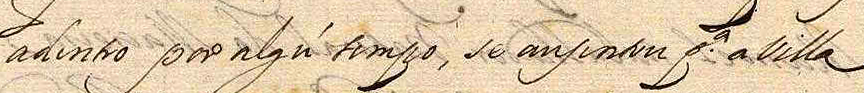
adentro por algū tempo, se ausentou p.a a villa
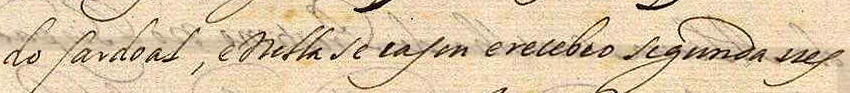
do Sardoal, e nella se cazou e recebeo segunda ues
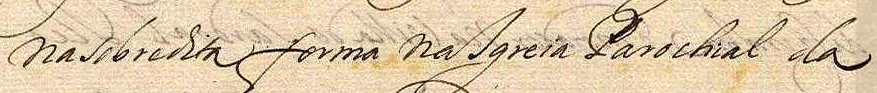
na sobredita forma na Igreia Parochial da
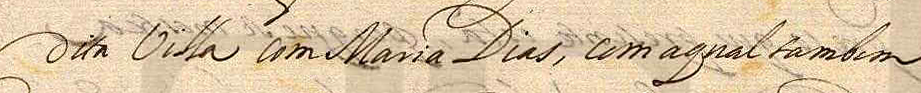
dita Villa com Maria Dias, com a qual tambem
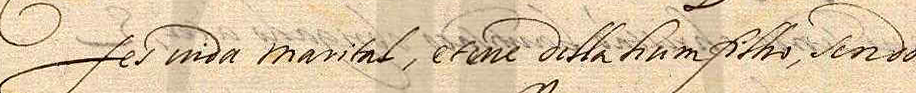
fes uida marital, e teue della hum filho, sendo
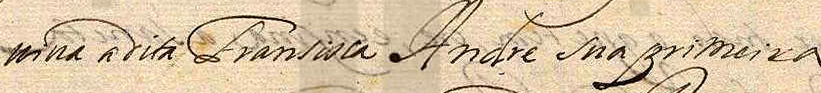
uiua a dita Fransisca Andre sua primeira
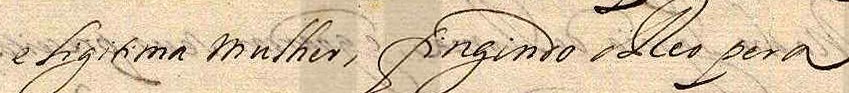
e ligitima mulher, fingindo o Reo pera
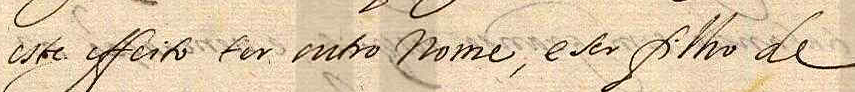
este effeito ter outro nome, e ser filho de
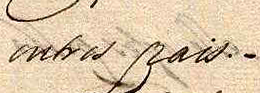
outros pais.
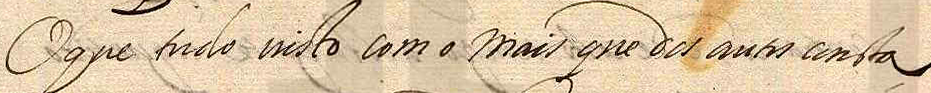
O que tudo uisto com o mais que dos autos consta,
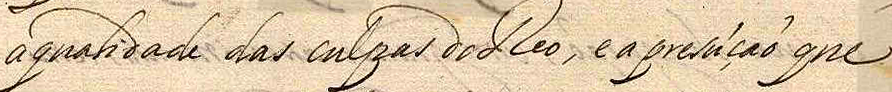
a qualidade das culpas do Reo, e a presūçaõ que
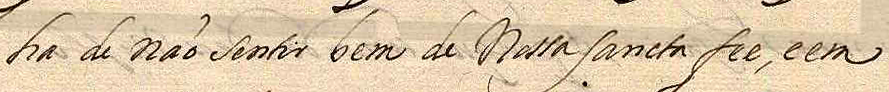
ha de não sentir bem de nossa sancta fee, e em
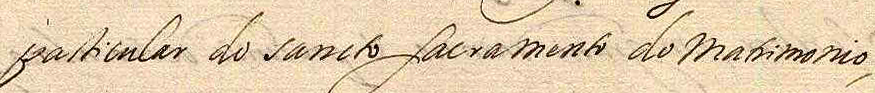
particular do sancto sacramento do matrimonio,
